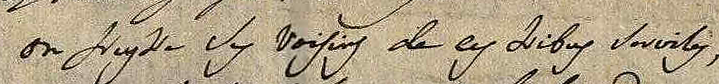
on frustra ses voisins de ces tribus Serviles,
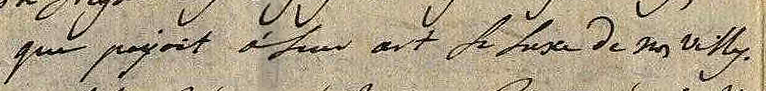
que payoit á Leur art Le Luxe de nos villes.
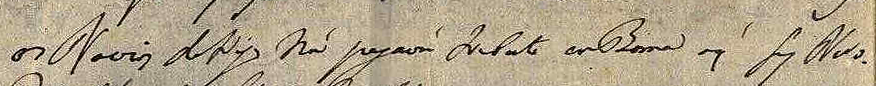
os Navios de trigo nā pagavā tributo en Roma o q̄ fez Nero
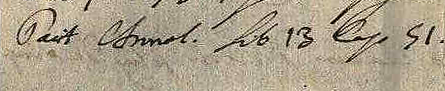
Tacit Annal. Lib 13 Cap 51.
